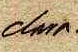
clara.
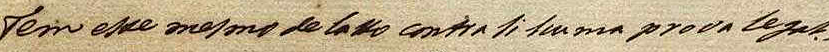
Tem este mesmo delatto contra si huma prova legal,
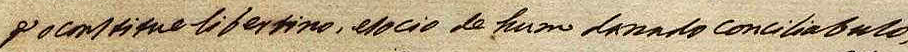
q̄ o constitue libertino, e socio de hum danado conciliabulo,
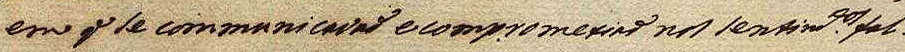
em q̄ se communicavaõ e comprometiaõ nos sentim.tos fal
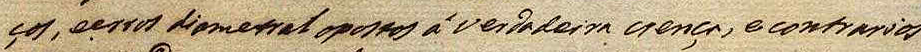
ços, e erros diametral opostos á verdadeira crença, e contrarios
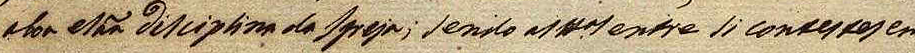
a boa e saã disciplina da Jgreja, sendo as tt.as entre si contestes em
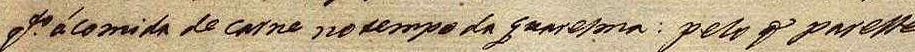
q.to á comida de carne no tempo da quaresma: pelo q̄ paresse
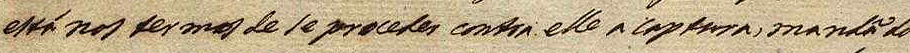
está nos termos de se proceder contra elle a captura, mandādo
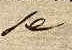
se.
